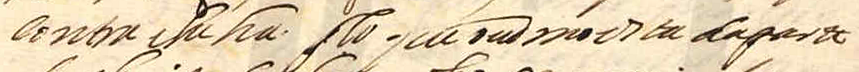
contra elle ha. plo que o admoesta da parte
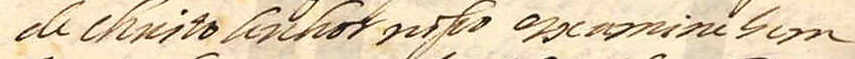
de christo senhor nosso esxamine bem
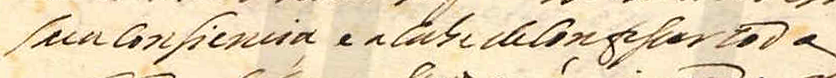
sua consiencia, e acabe de confessar toda
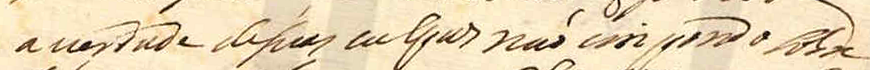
a uerdade de suas culpas naõ impondo sobre
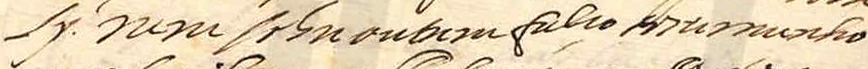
sy. nem sobre outrem falso testemunho
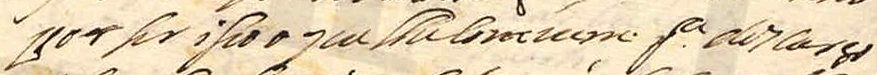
por ser isso o que lhe comuem p.a descargo
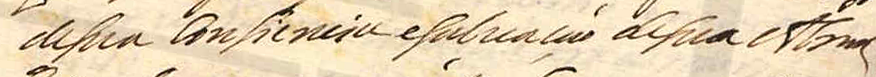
de sua consiencia e saluaçaõ de sua Alma
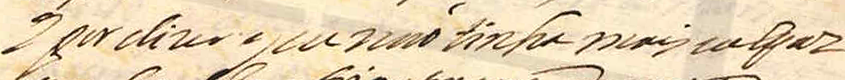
E por dizer que naõ tinha mais culpaz
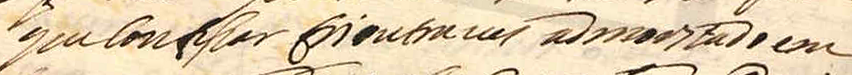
que confessar foi outra ues admoestado em
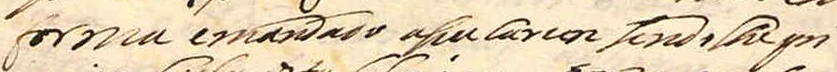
forma e mandado a seu carcere sendolhe pri
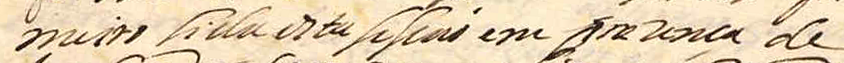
meiro lida esta sessaõ em prezença de
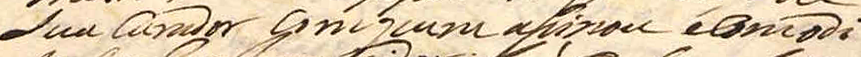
seu curador com quem assinou, e com o di
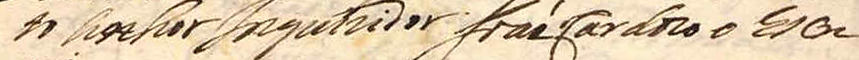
to senhor Jnquizidor Joaõ Cardozo o Escre
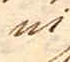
ui
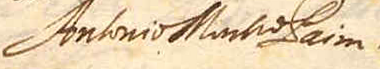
Antonio Montro Paim
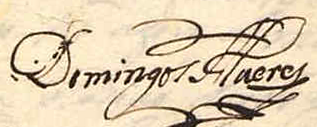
Domingos Alueres
